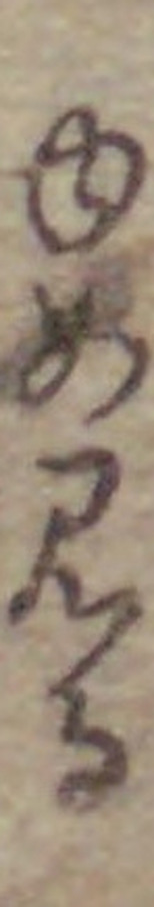ゆめ見る
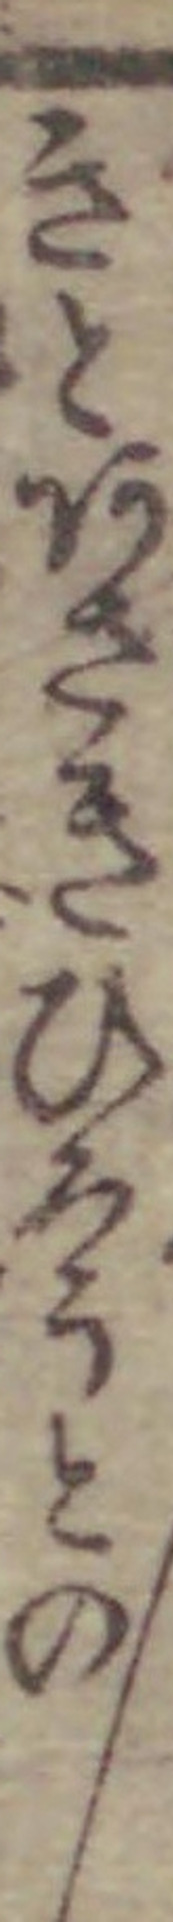きとあさきひろうとの
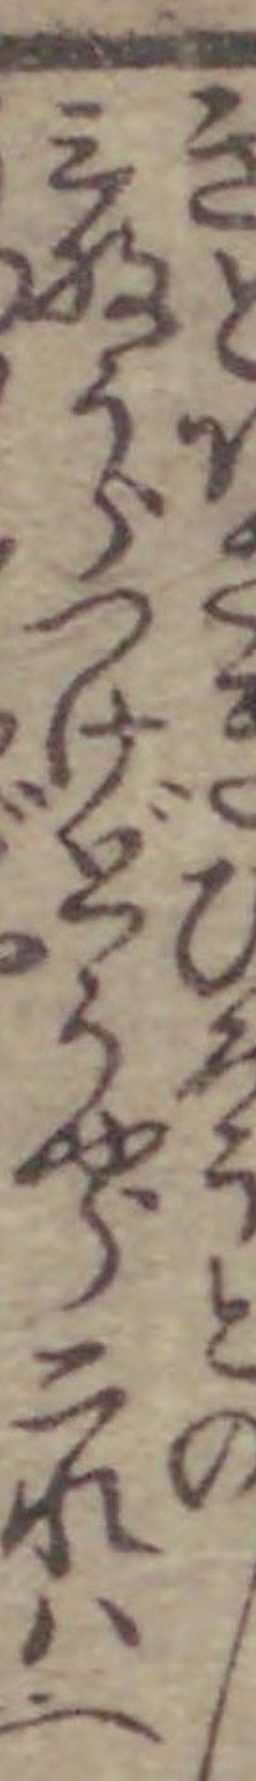三枚うらつけどうやらこれは
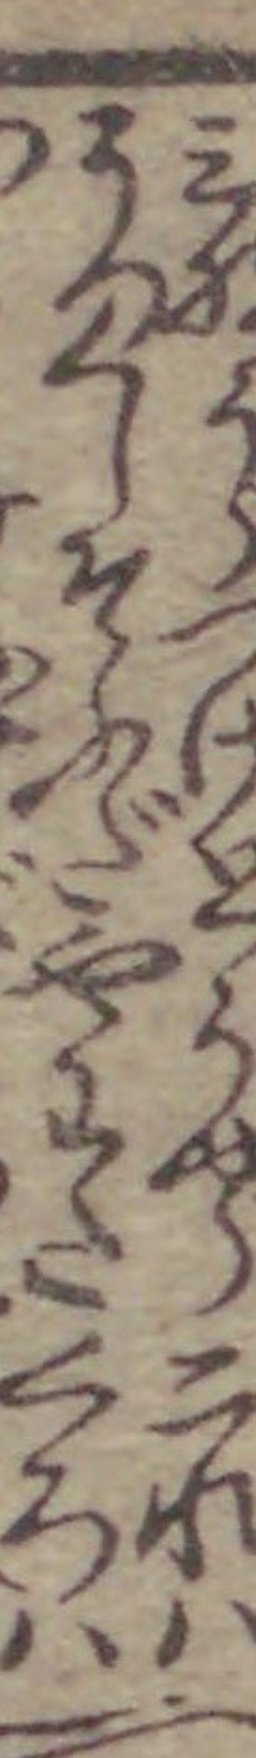うつくしそふだやわたくろは
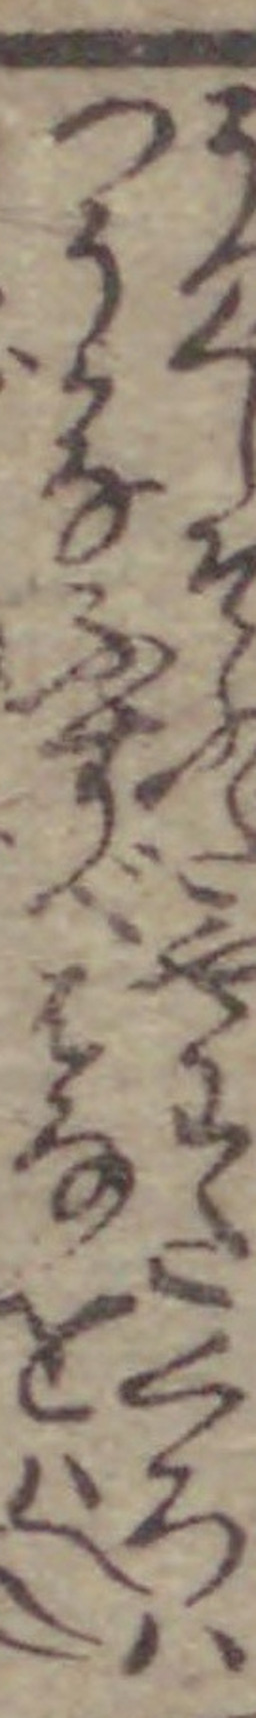つうかなふすべはなをは
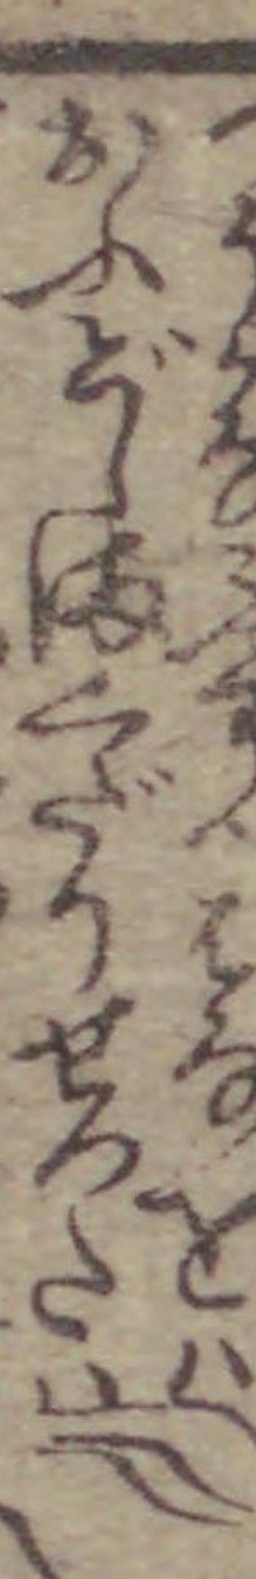おふどしまくだりせつたは
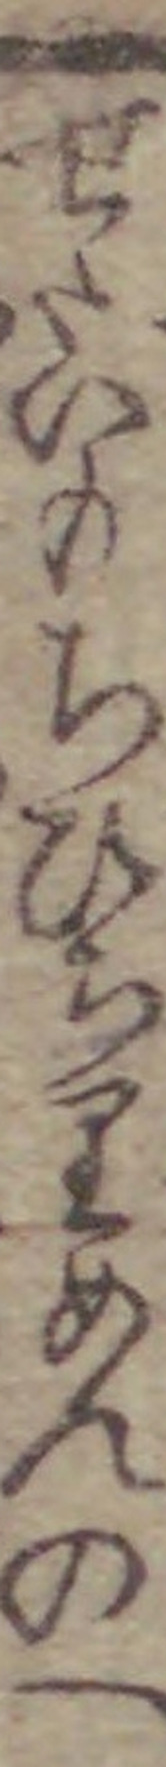せたいもちひちりめんの
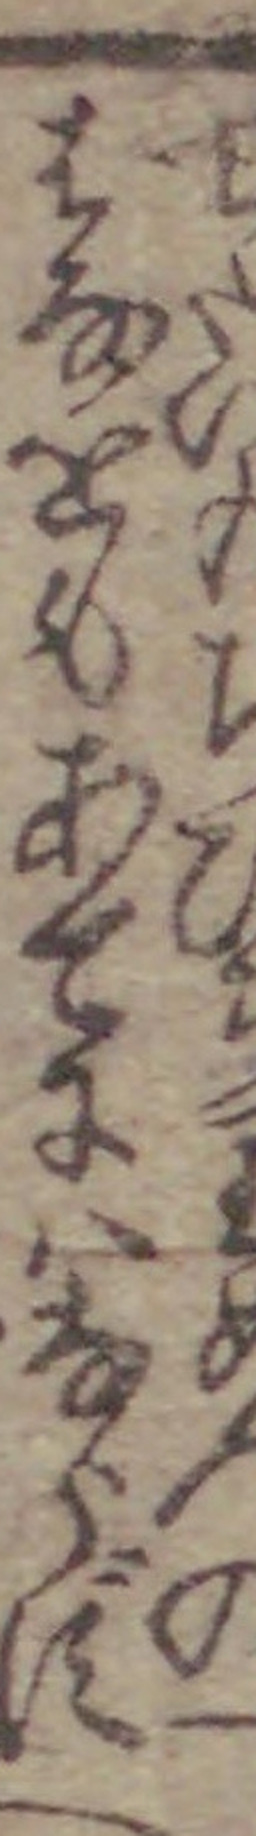はなをもあてにはならず
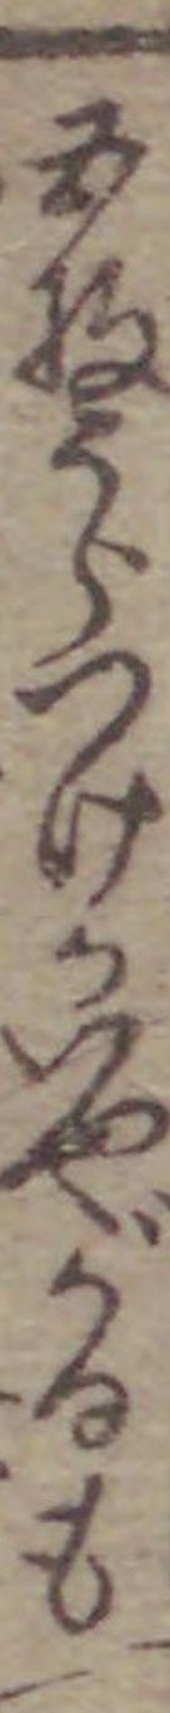五枚うらつけかいやがるも
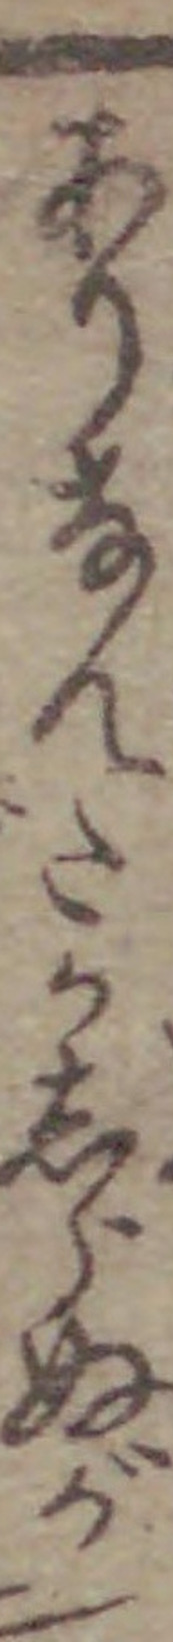ありなんたかしらぬが
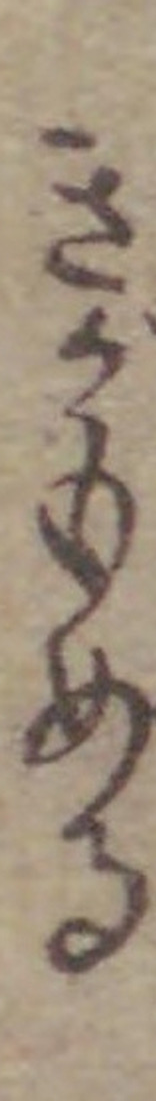きがもめる

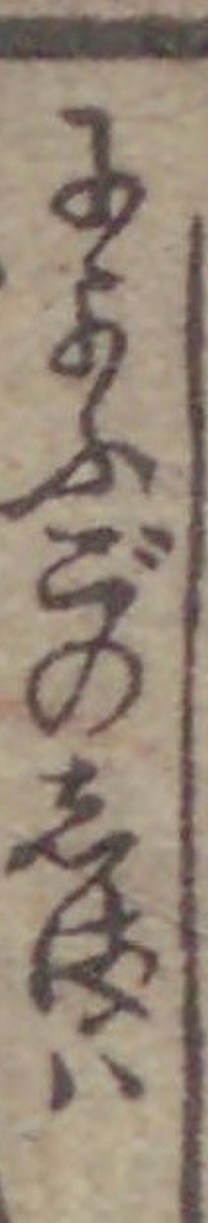によふごのしまは
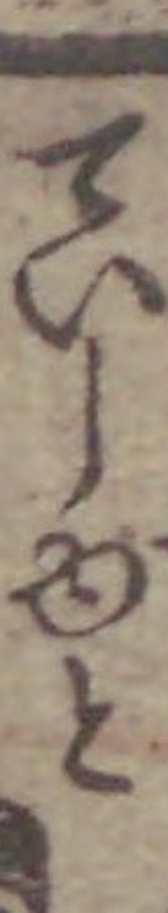ていしゆと
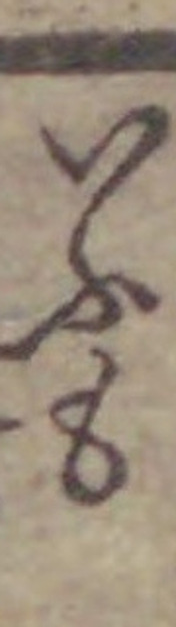いふも
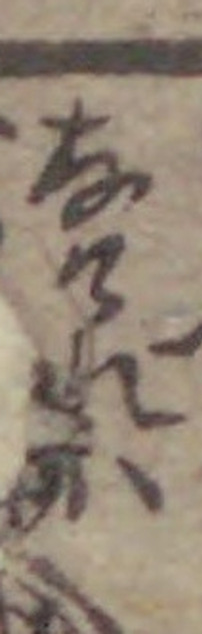なけれは
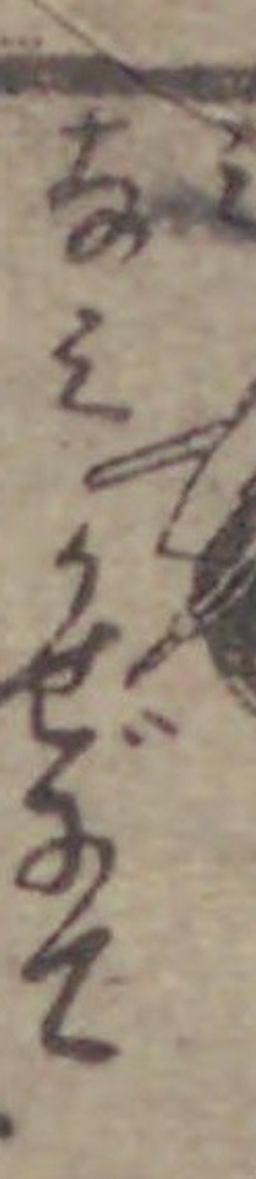なみかぜにて
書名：近頃嶋めぐり 3巻
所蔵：国立国会図書館 National Diet Library, JAPAN
